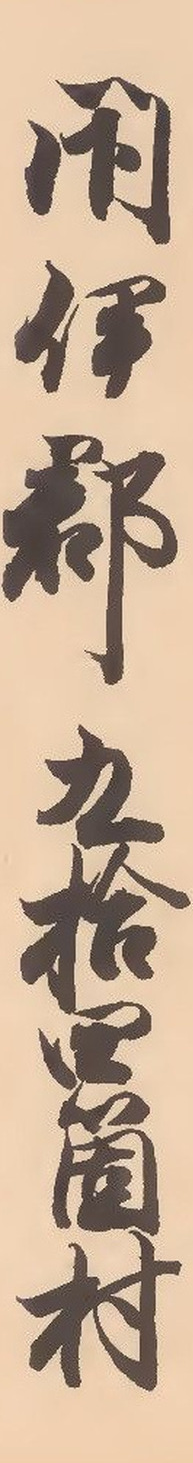閑伊郡九拾四箇村
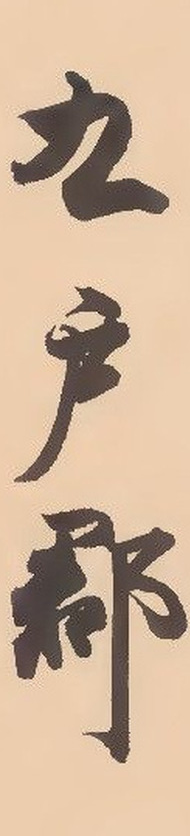九戸郡
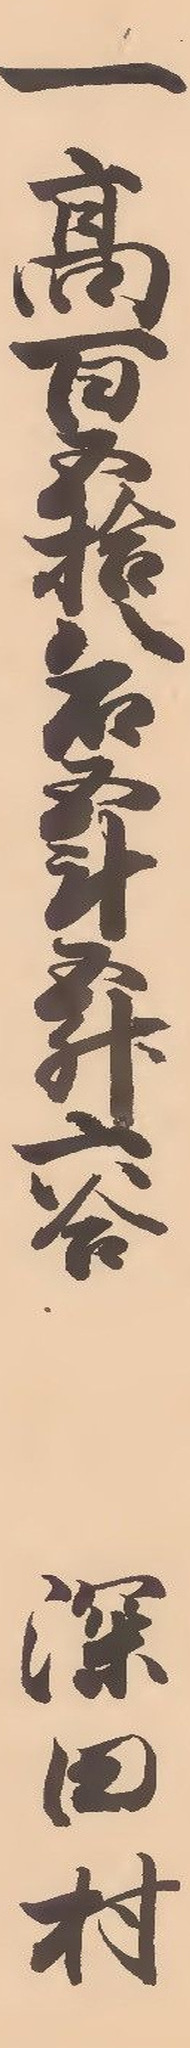一高百五拾八石五斗五升六谷深田村
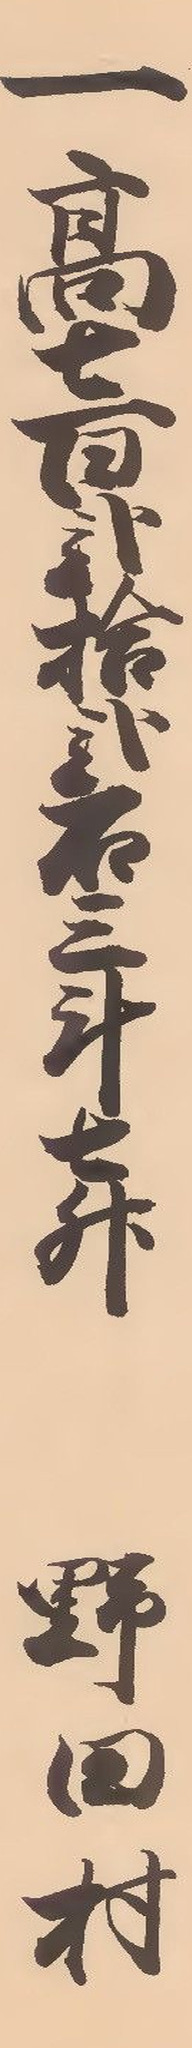一高七百弐拾弐石三斗七升野田村
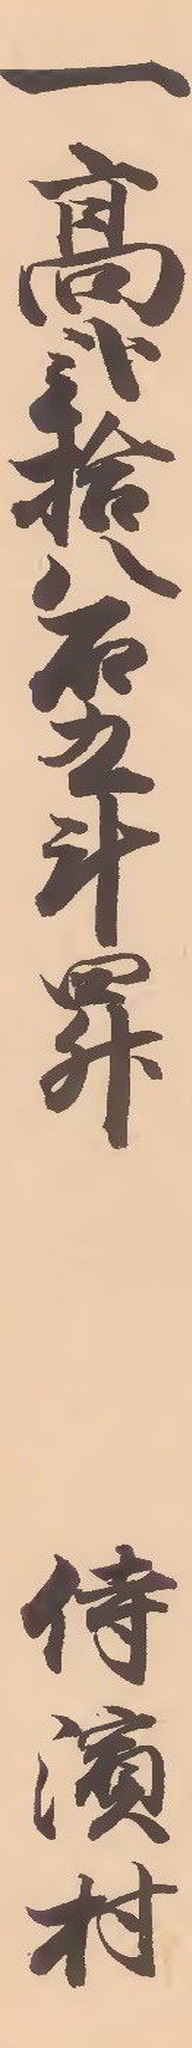一高弐拾八石九斗四升侍浜村

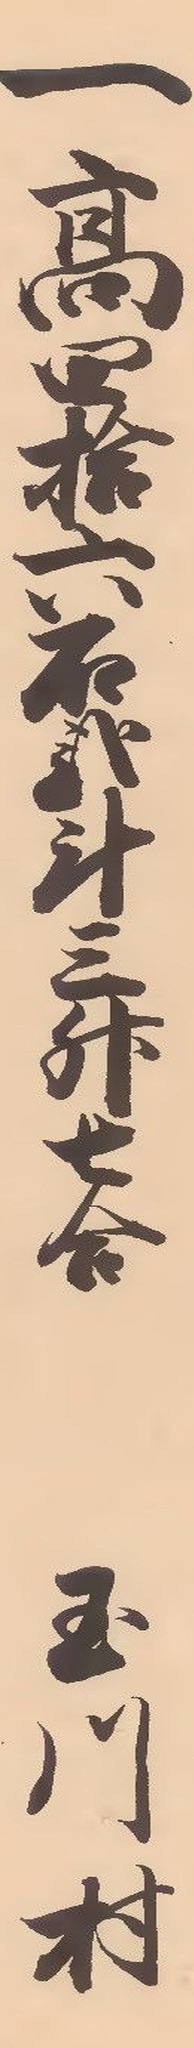一高四拾六石弐斗三升七合玉川村
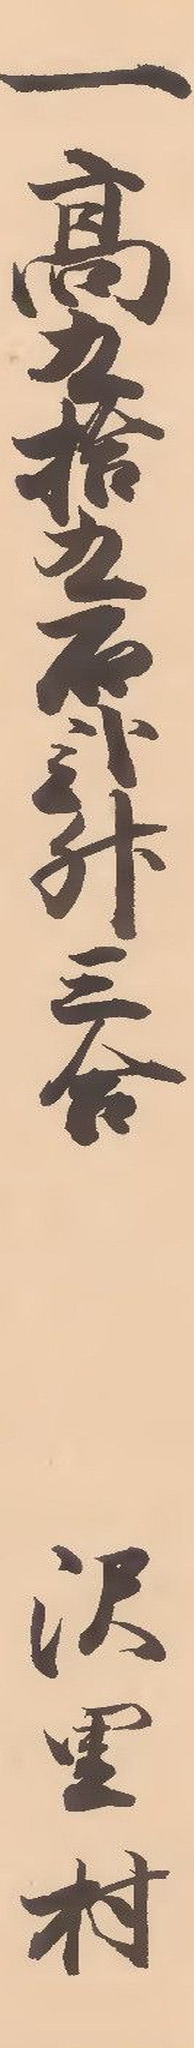一高九拾九石弐升三合沢里村
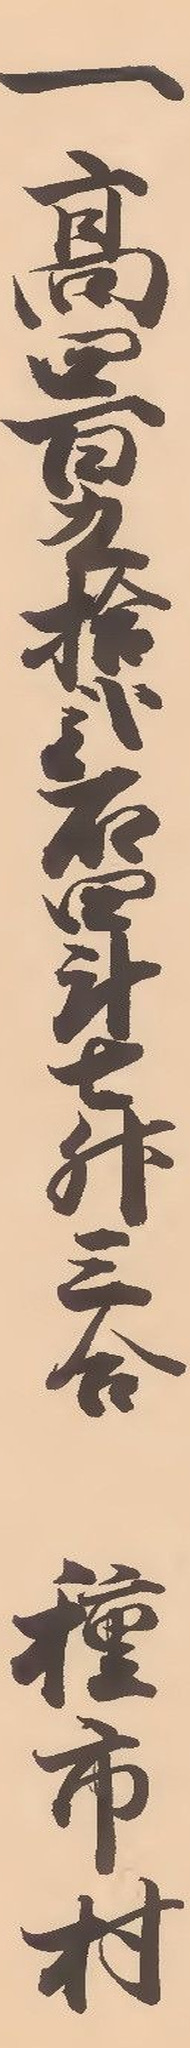一高四百九拾弐石四斗七升三合種市村
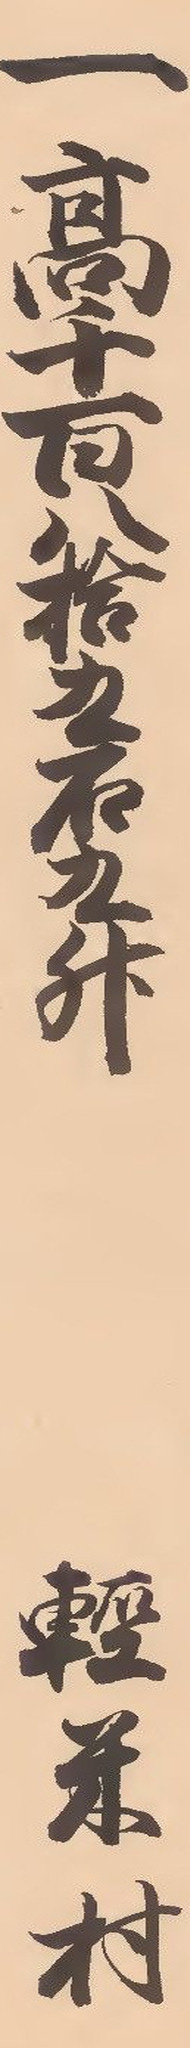一高千百八拾九石九升軽米村
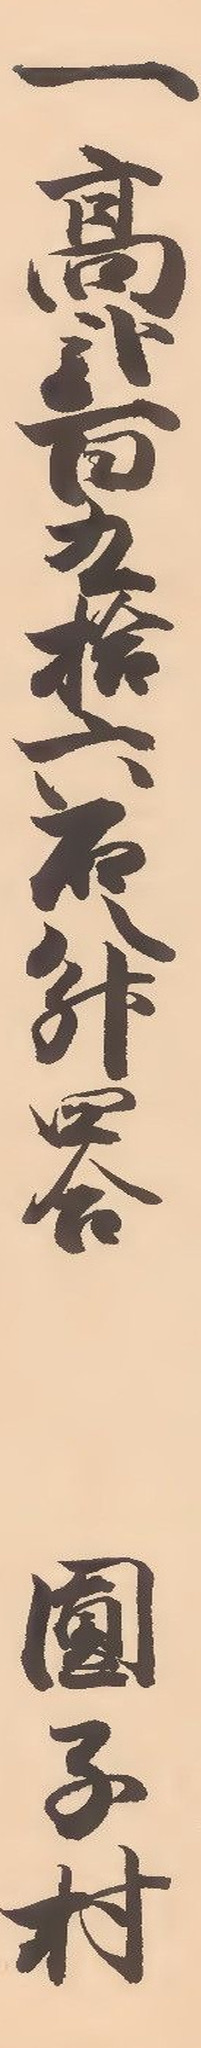一高弐百九拾六石八升四合円子村
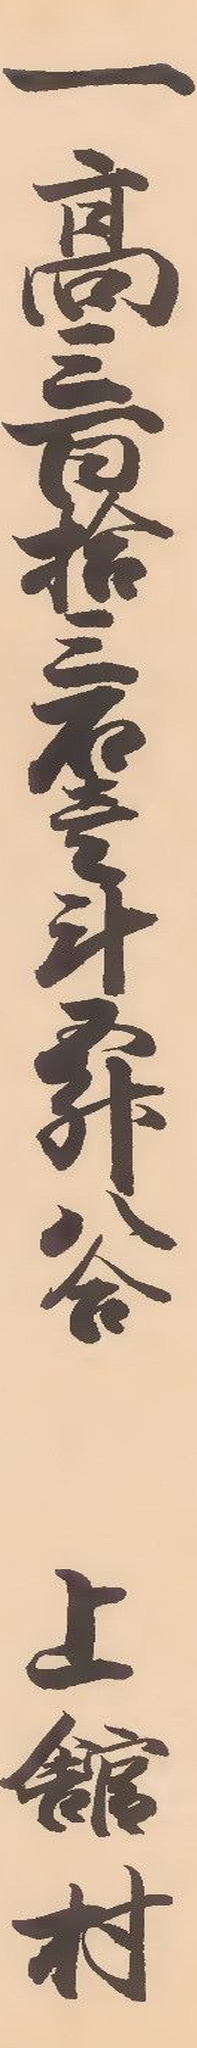一高三百拾三石壱斗五升八合上舘村
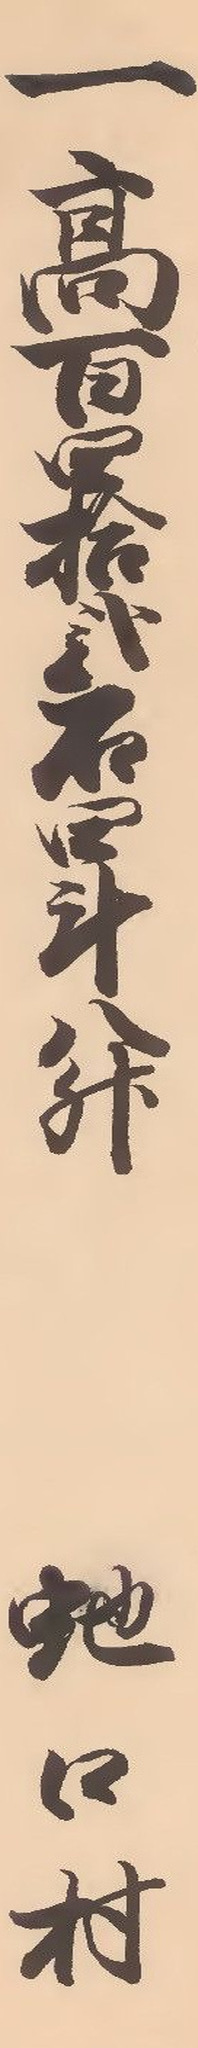一高百四拾弐石四斗八升蛇口村
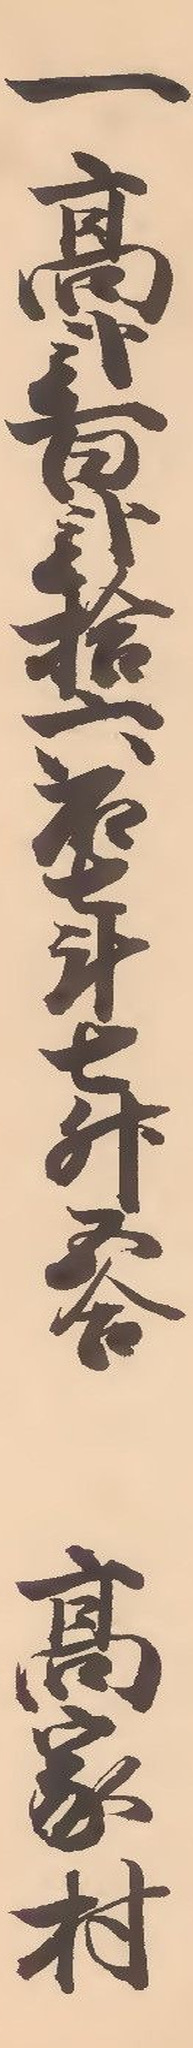一高弐百弐拾六石七斗七升五合高家村

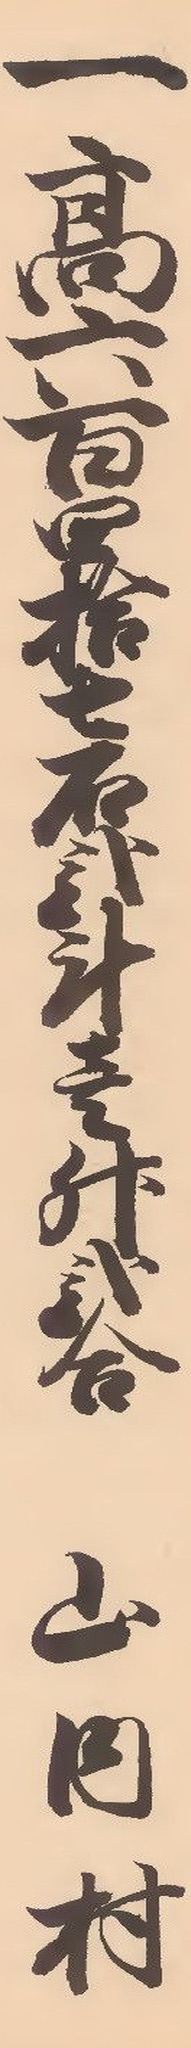一高六百四拾七石弐斗壱升弐合山内村
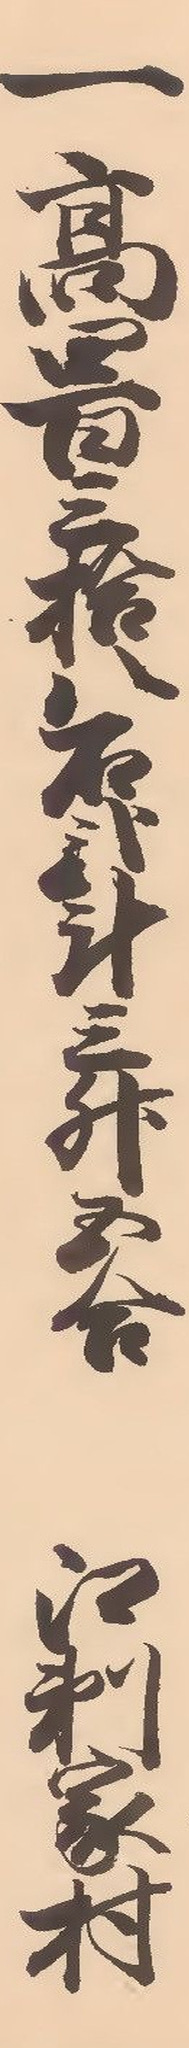一高四百三拾八石弐斗三升五合江刺家村
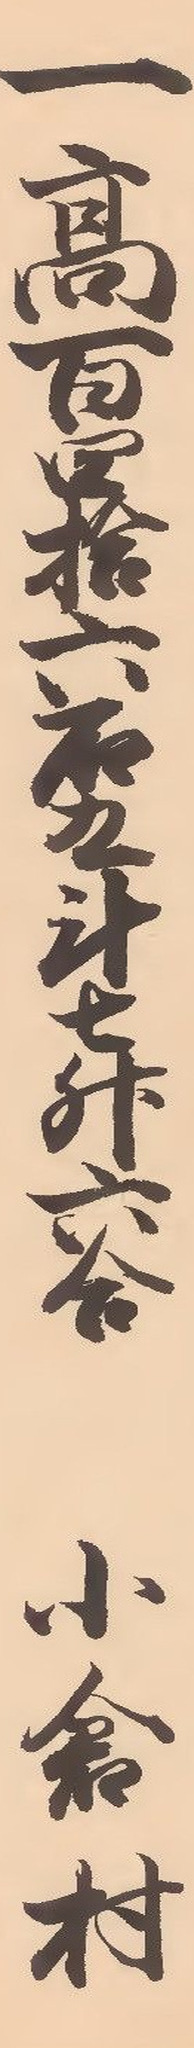一高百四拾六石九斗七升六合小倉村
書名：陸奥国郷帳　６
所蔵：国立公文書館 National Archives of Japan
